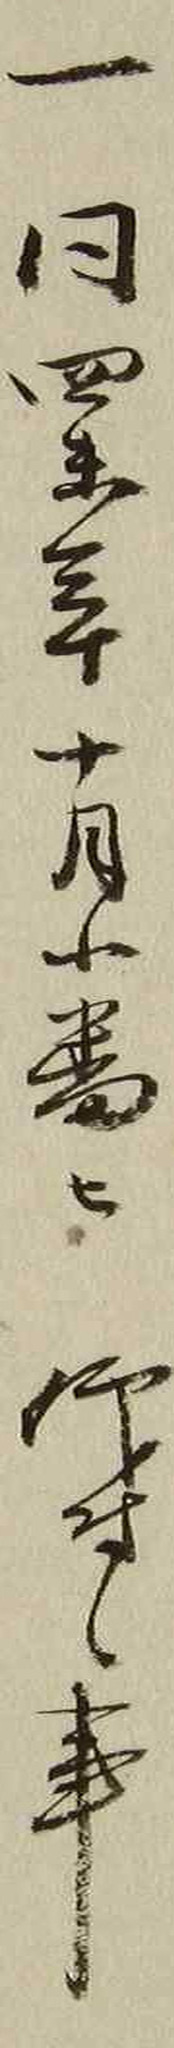一同四未年十月小番被仰付候事
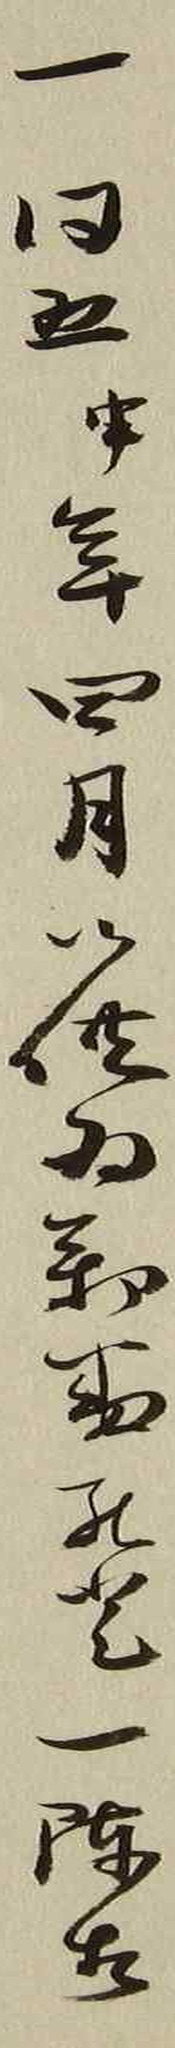一同五申年四月御供為勤番罷登一陣相
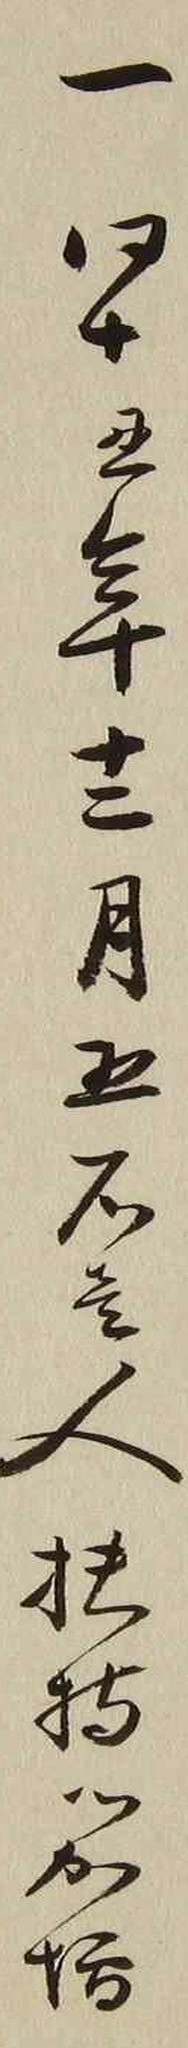一同十丑年十二月五石壱人扶持御加増
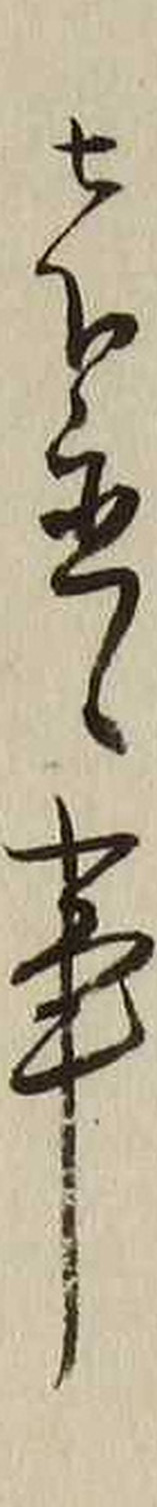被下置候事
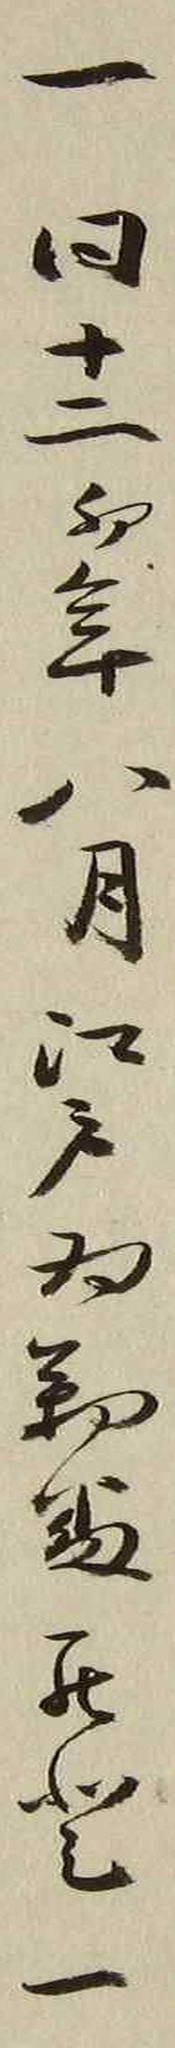一同十二卯年八月江戸為勤番罷登一
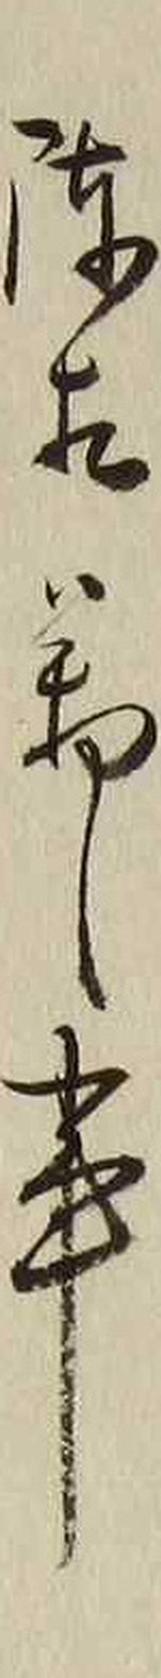陣相勤候事
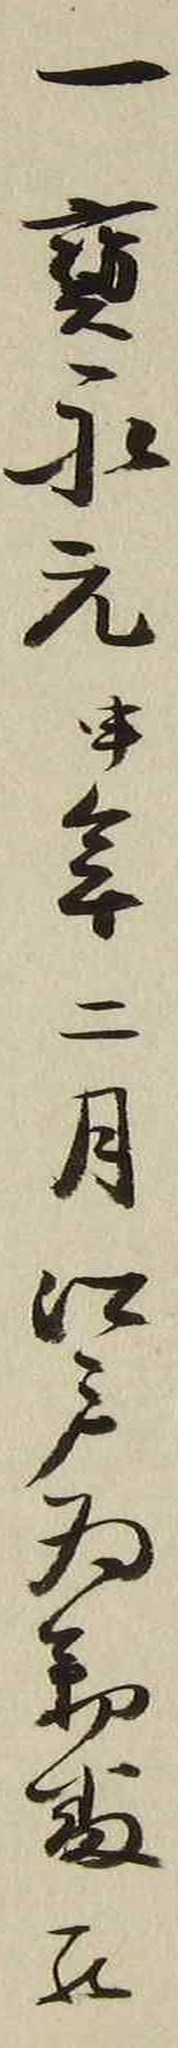一宝永元申年二月江戸為勤番罷
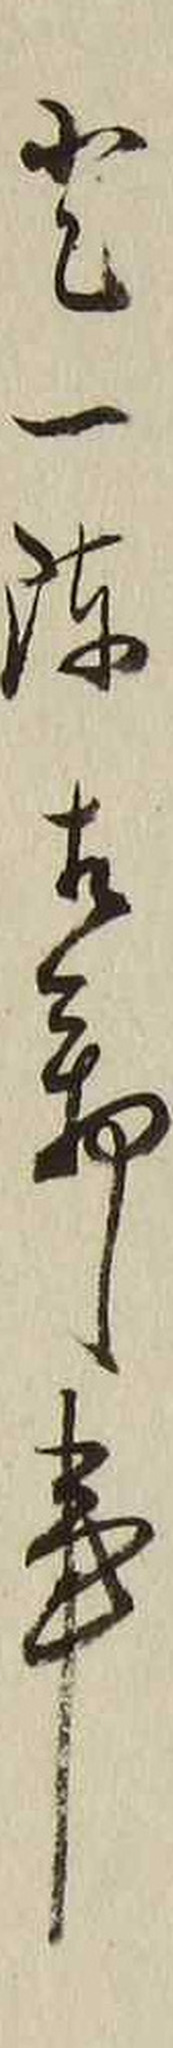登一陣相勤候事
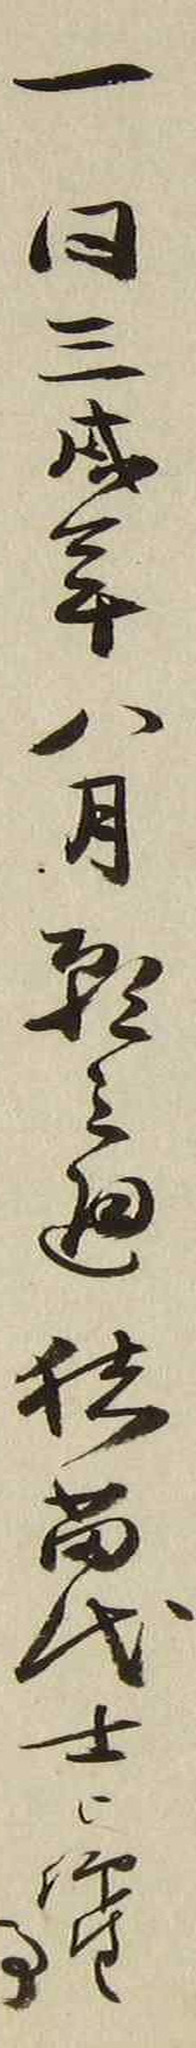一同三戌年八月願之通猪苗代士被仰付候事
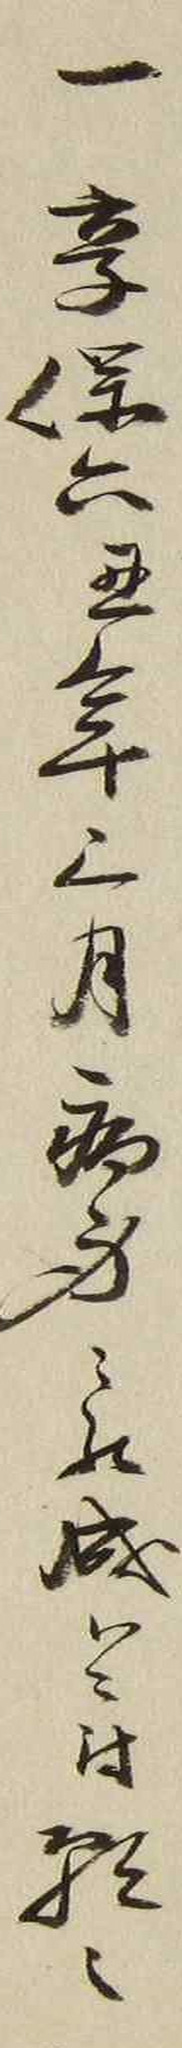一享保六丑年三月病身ニ罷成候ニ付願之
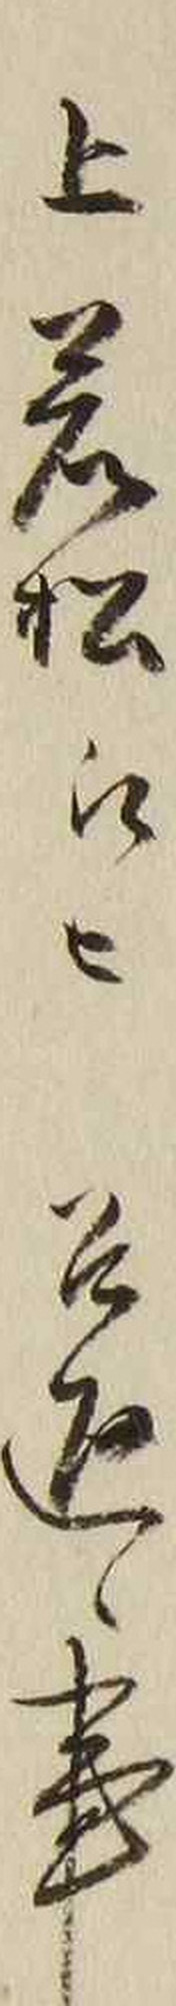上若松江被召返候事

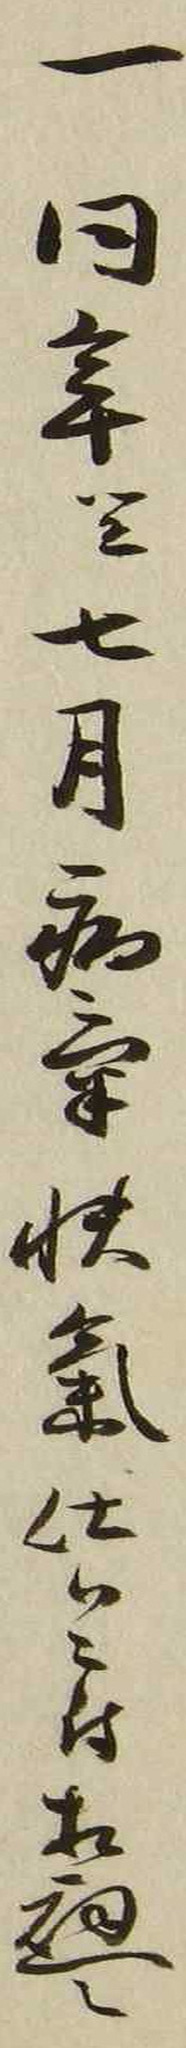一同年閏七月病気快気仕候ニ付相応に
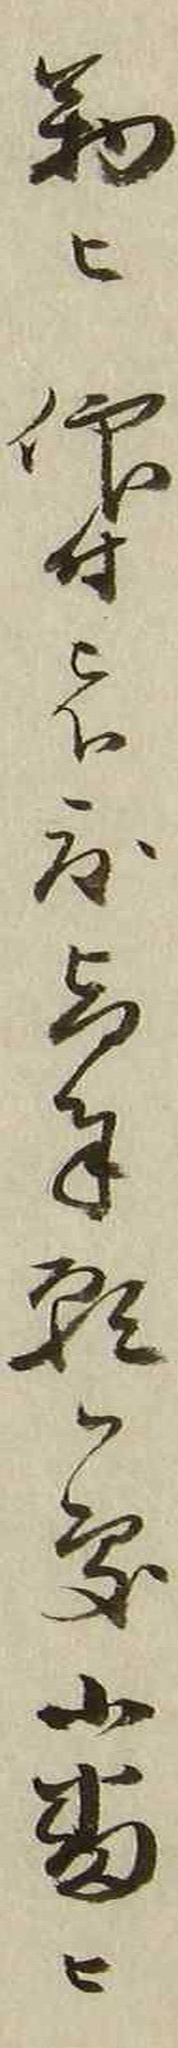勤被仰付被下度旨奉願候処小番被
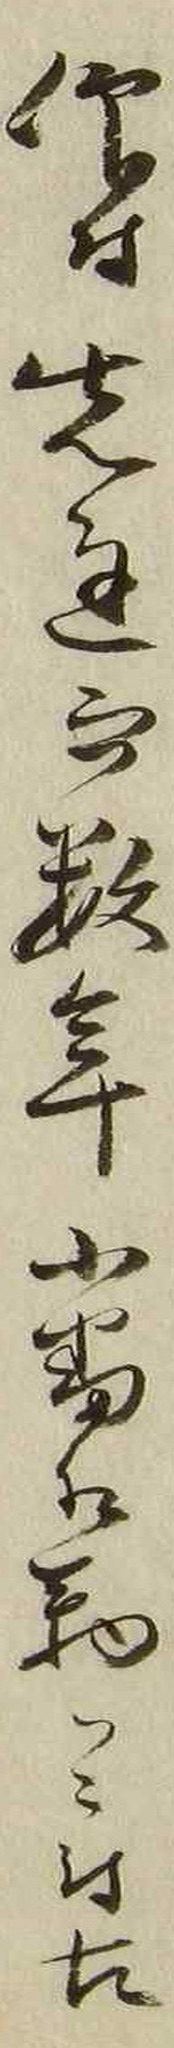仰付先達而数年小番相勤候ニ付古
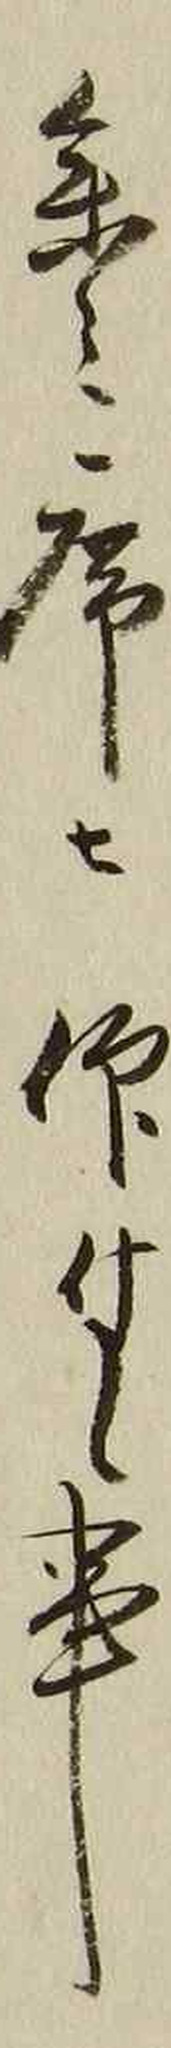参之席被仰付候事
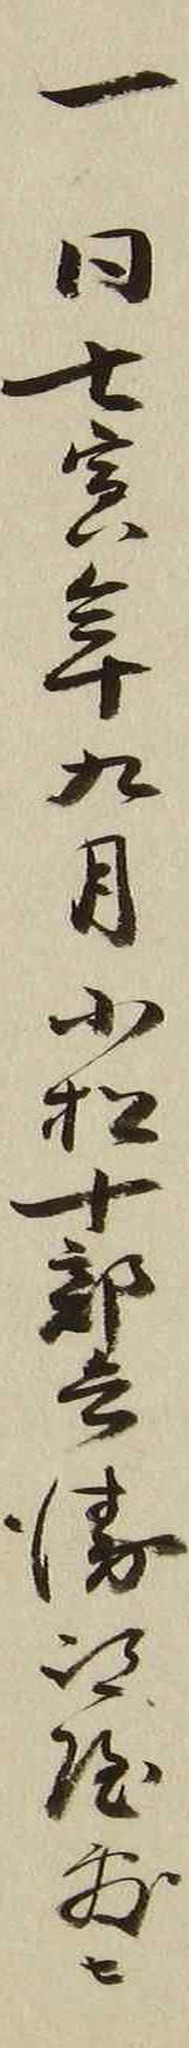一同七寅年九月小松十郎兵衛跡屋敷被
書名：諸士系譜　巻之288　さ之部20
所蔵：会津若松市立会津図書館
